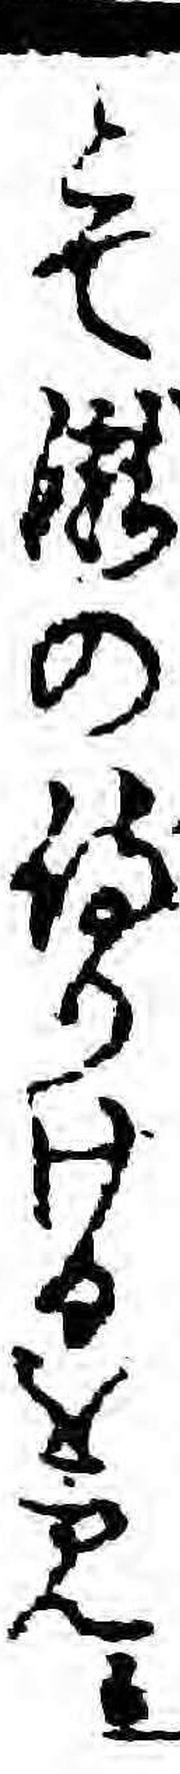とて瀧の侍りけるを見に
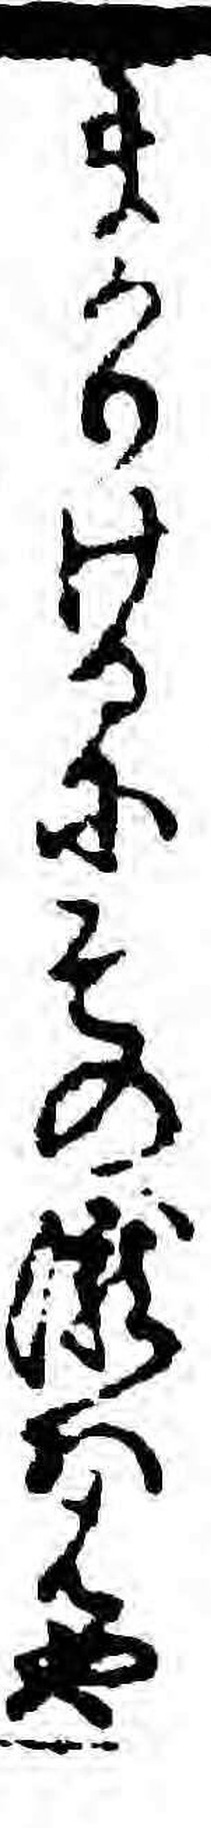まかりけるにその瀧ははや
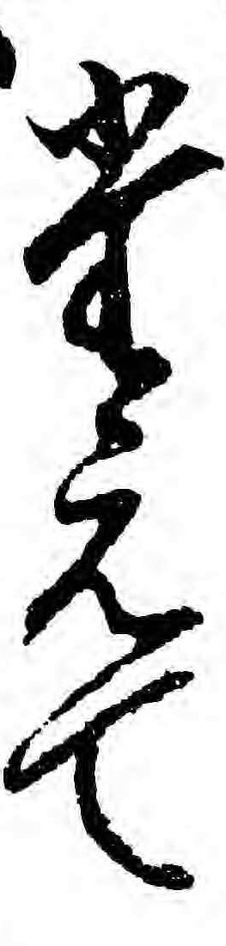たえて
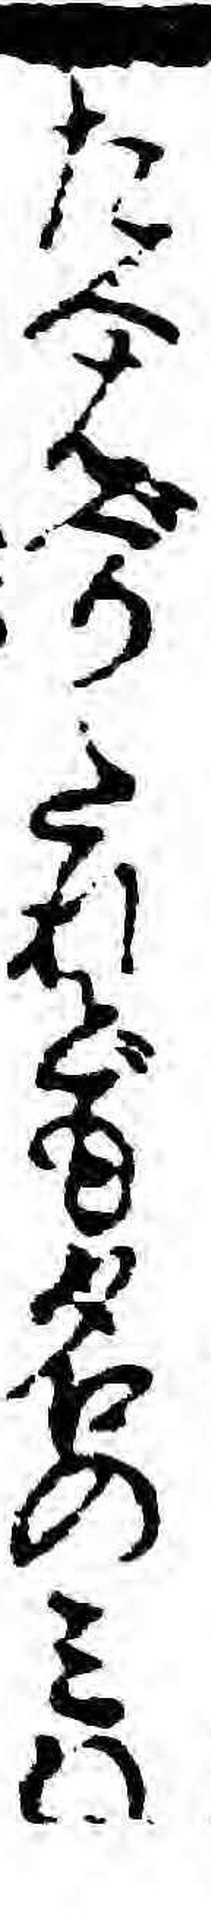たへはべりたれども名のみは
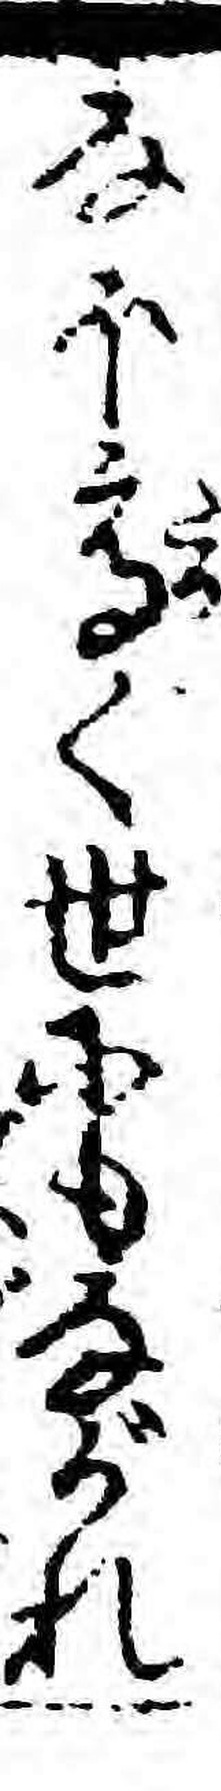なほ高く世にもながれ
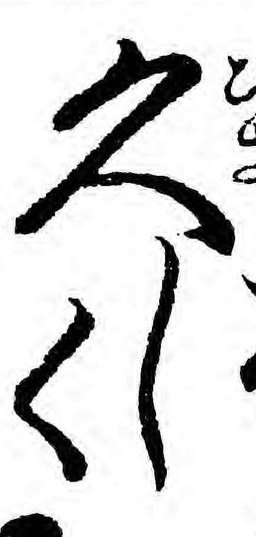久しく
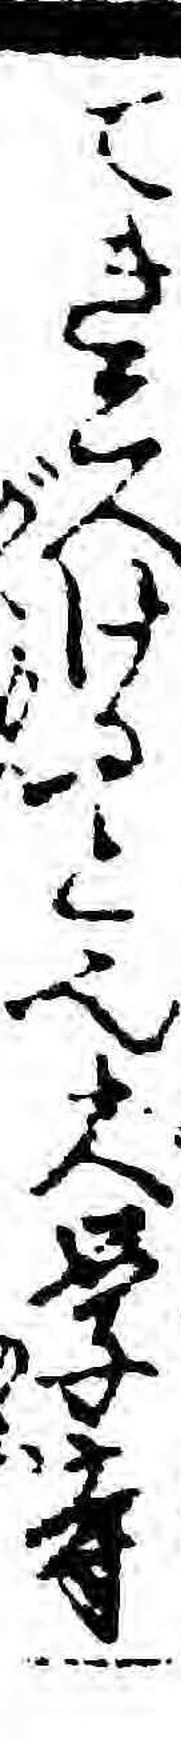てきこへけると也大学寺
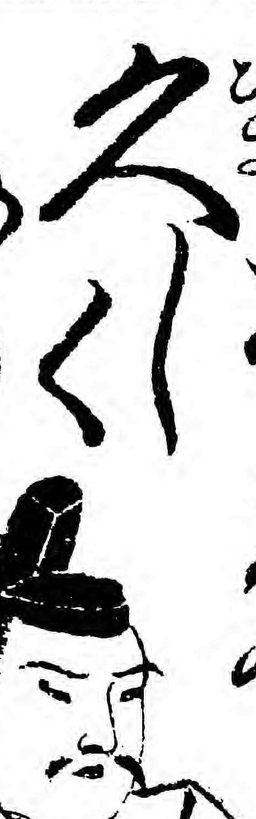久しく
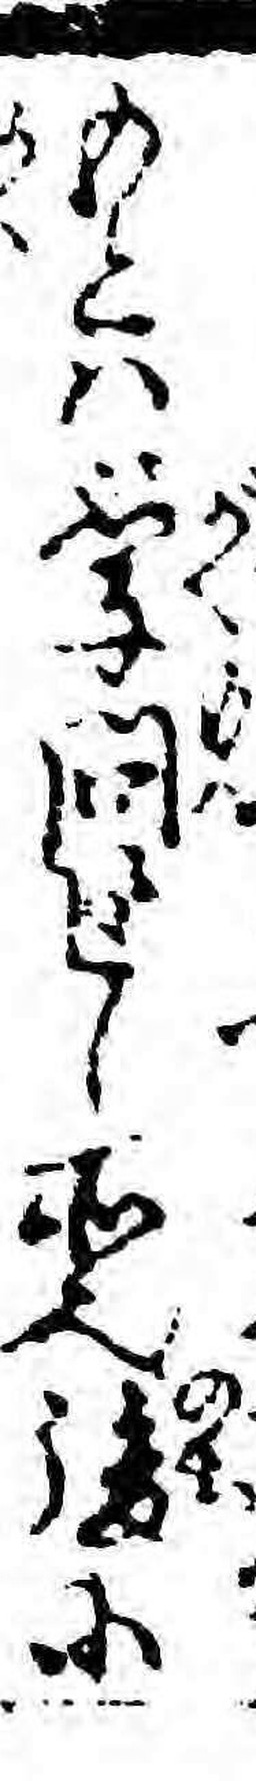もとは学問せし所也後に
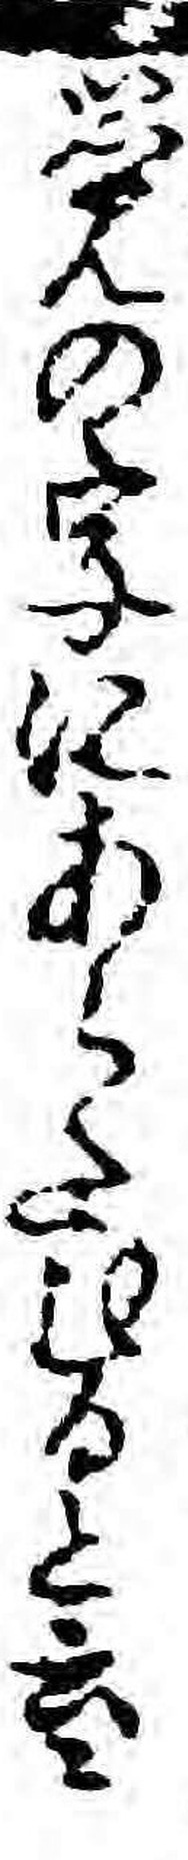覚の字にあらたむると云々
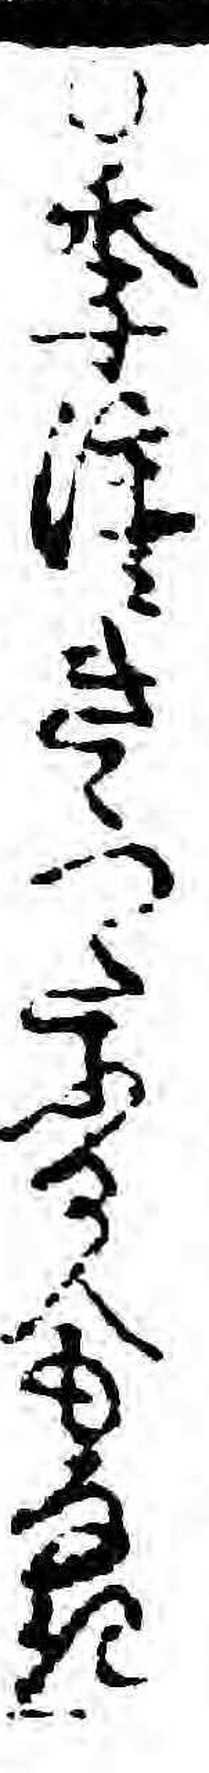〇季注にきゝつたふる人もなき
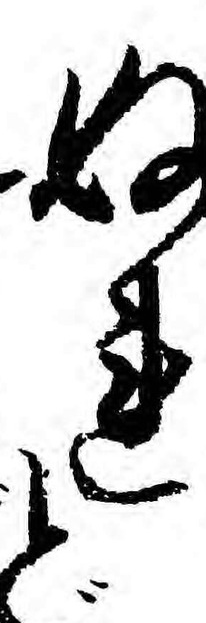ぬれど
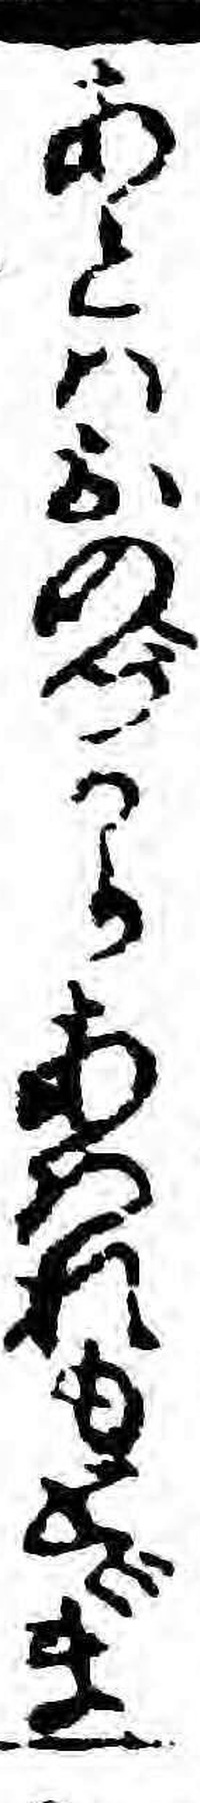あとはおのづからあはれもとゞま
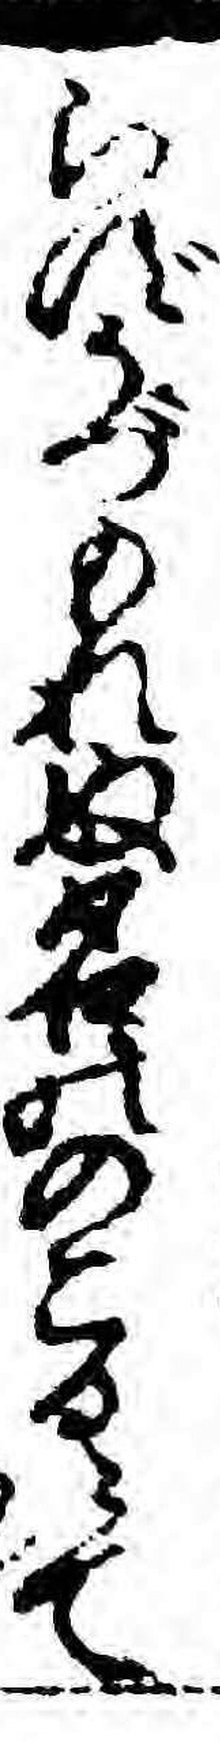らずうづもれぬ名ののこるにて
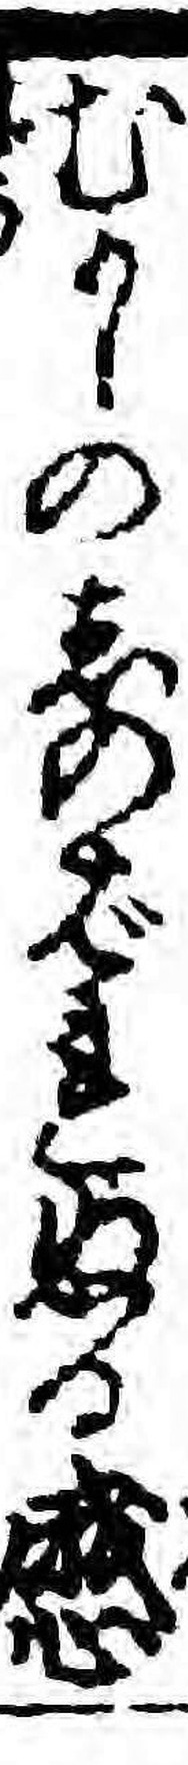むかしのしのばれぬる感
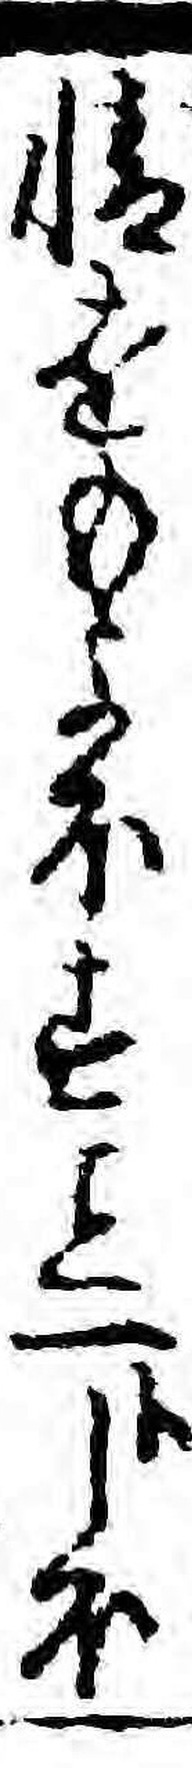情をもよほすこと一トしほ
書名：頭書和歌注譯／壽賀多百人一首小倉錦
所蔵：国文学研究資料館
